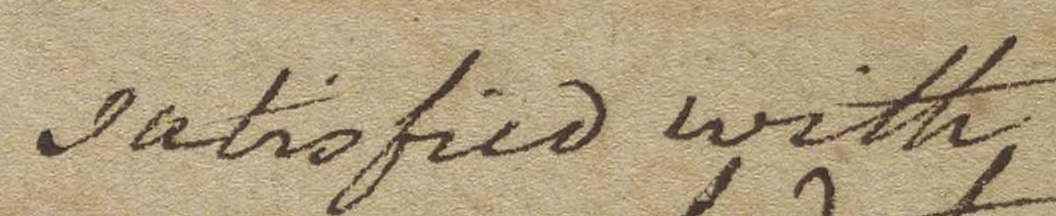satisfied with
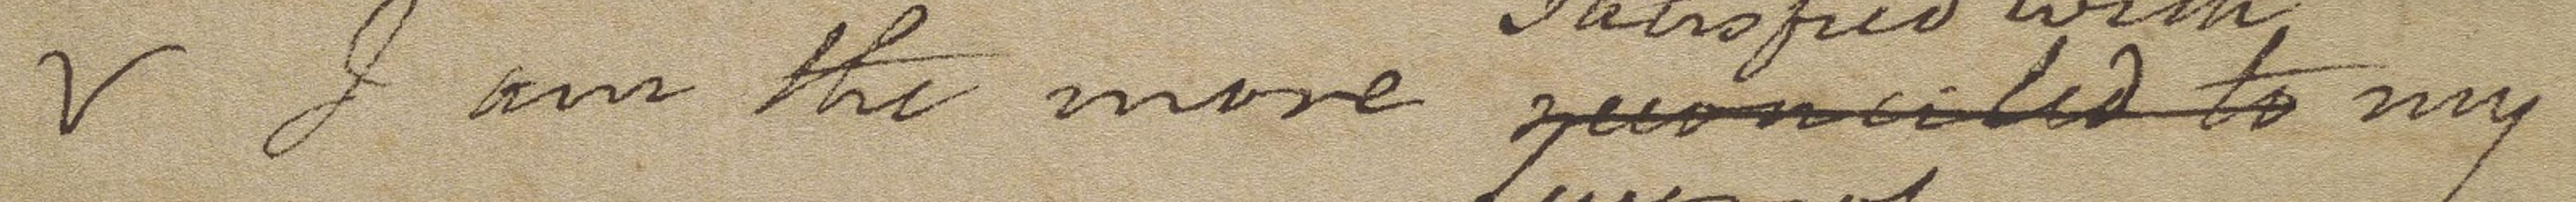V I am the more [reconciled] my
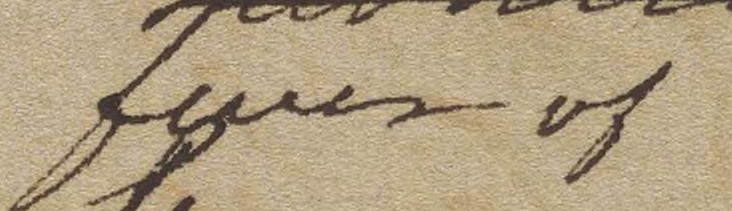fever of
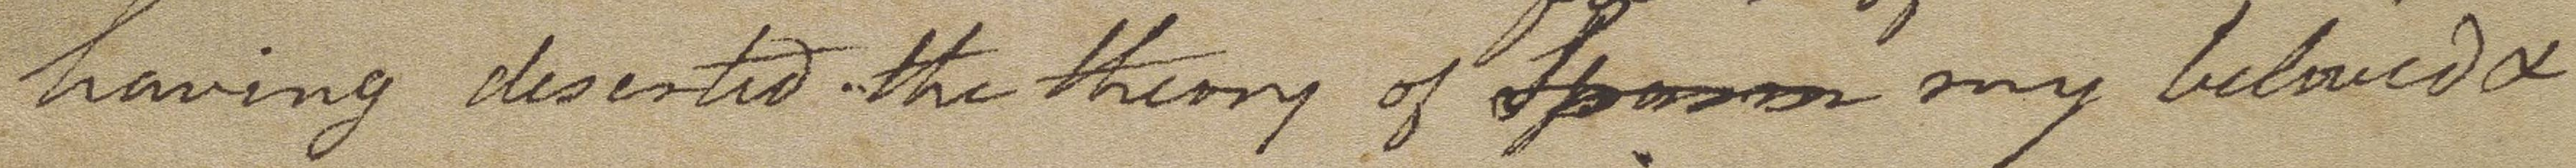having deserted the theory of [Spasm] my beloved &
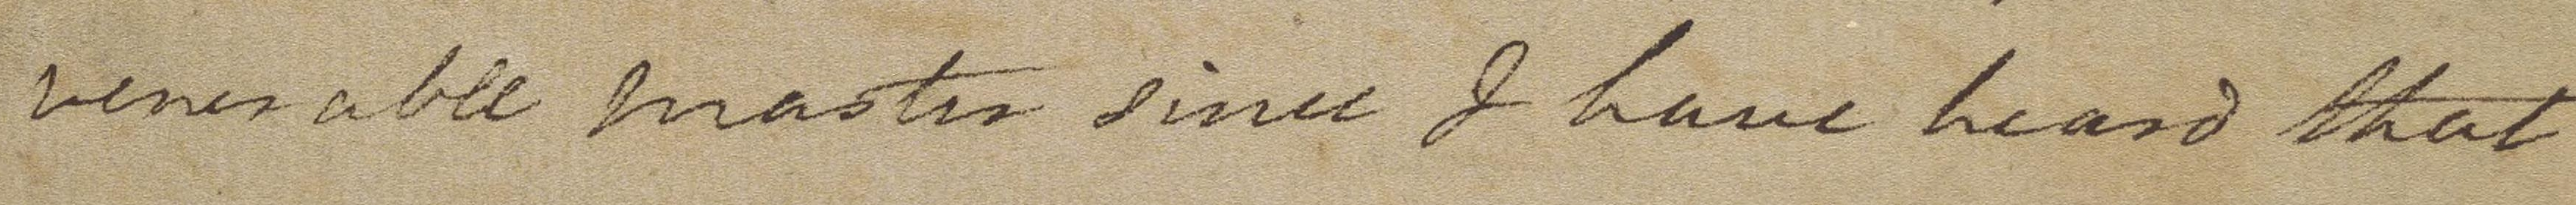venerable master since I have heard that
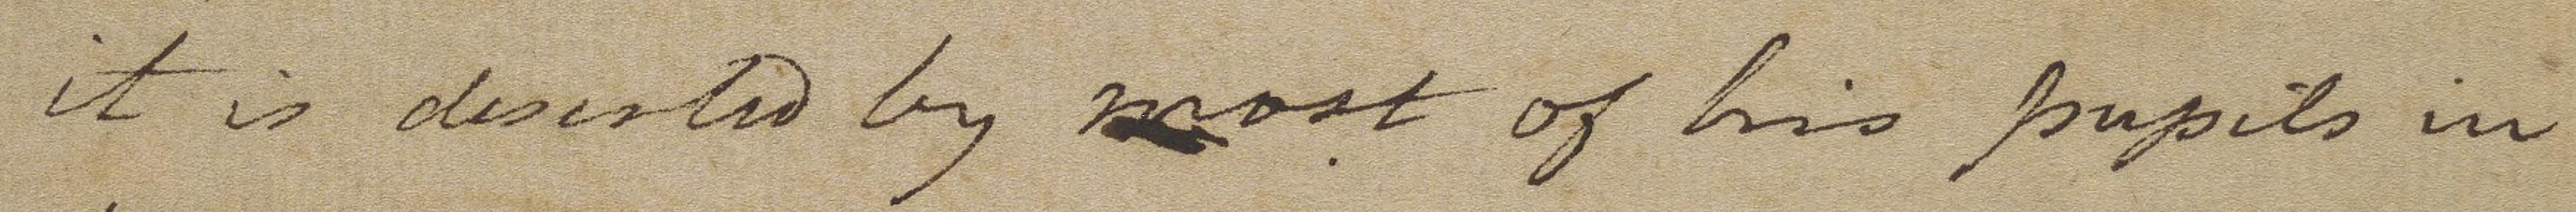it is deserted by most of his pupils in
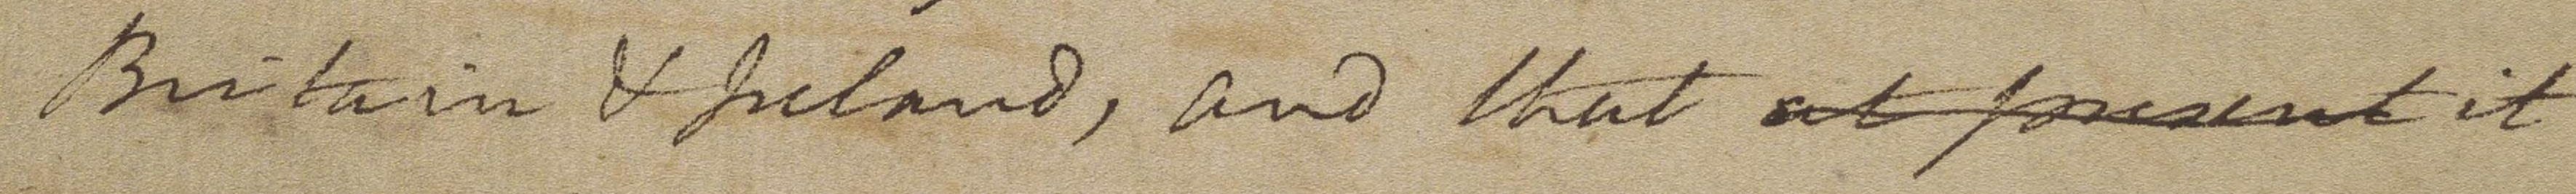Britain & Ireland, and that [at present] it
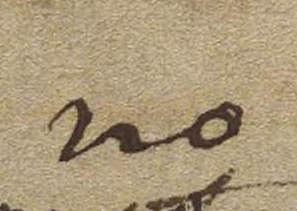no
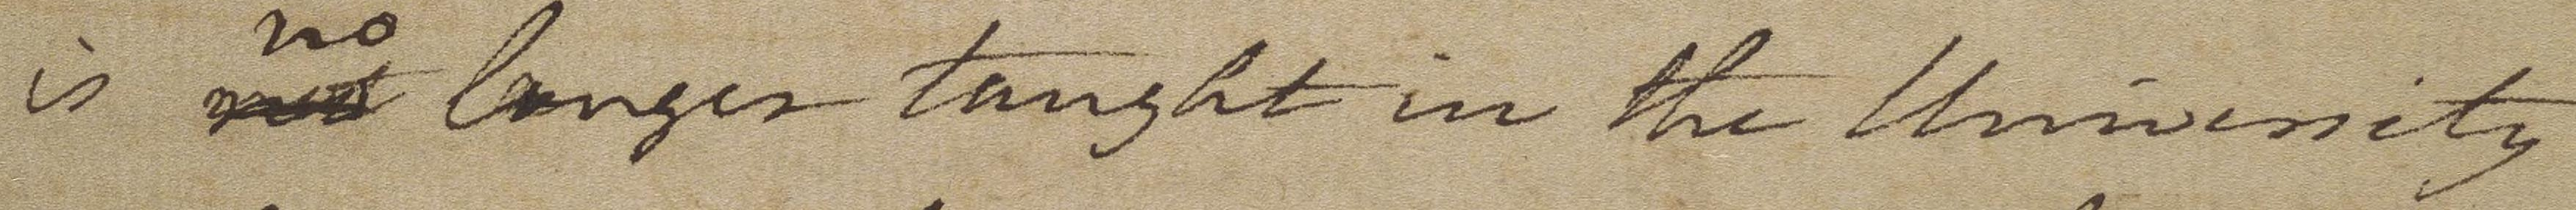is [not] longer taught in the University
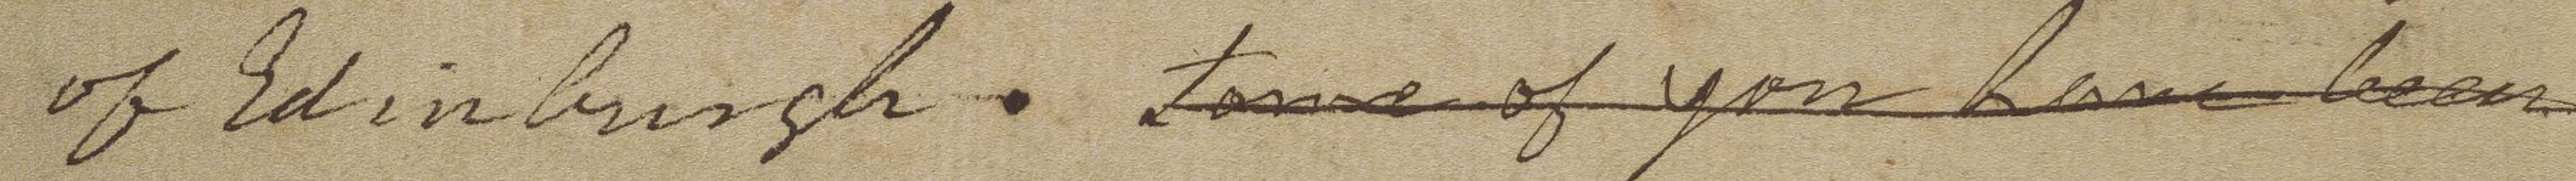of Edinburgh. Those of you have been
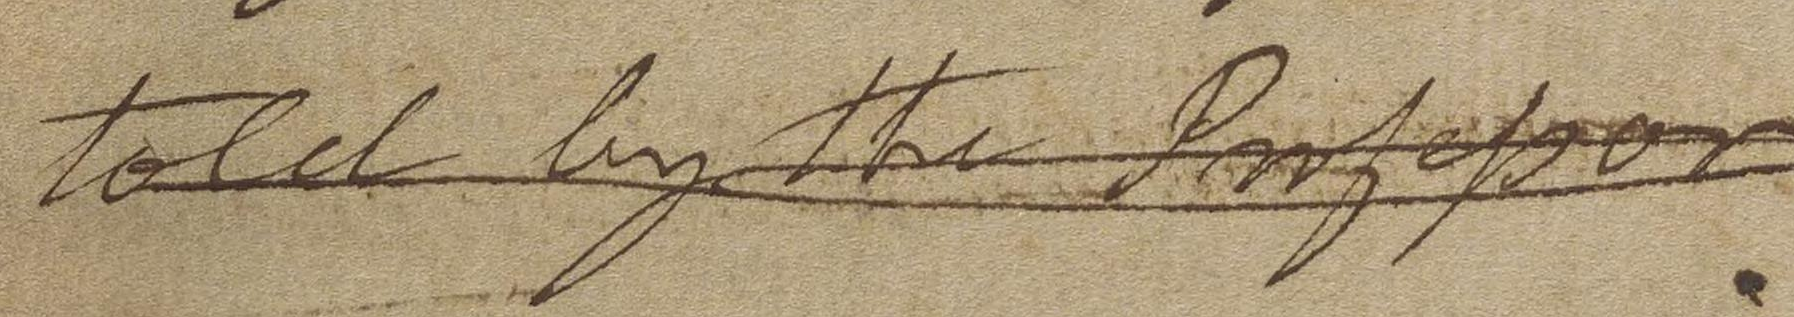todl by the Professor.
